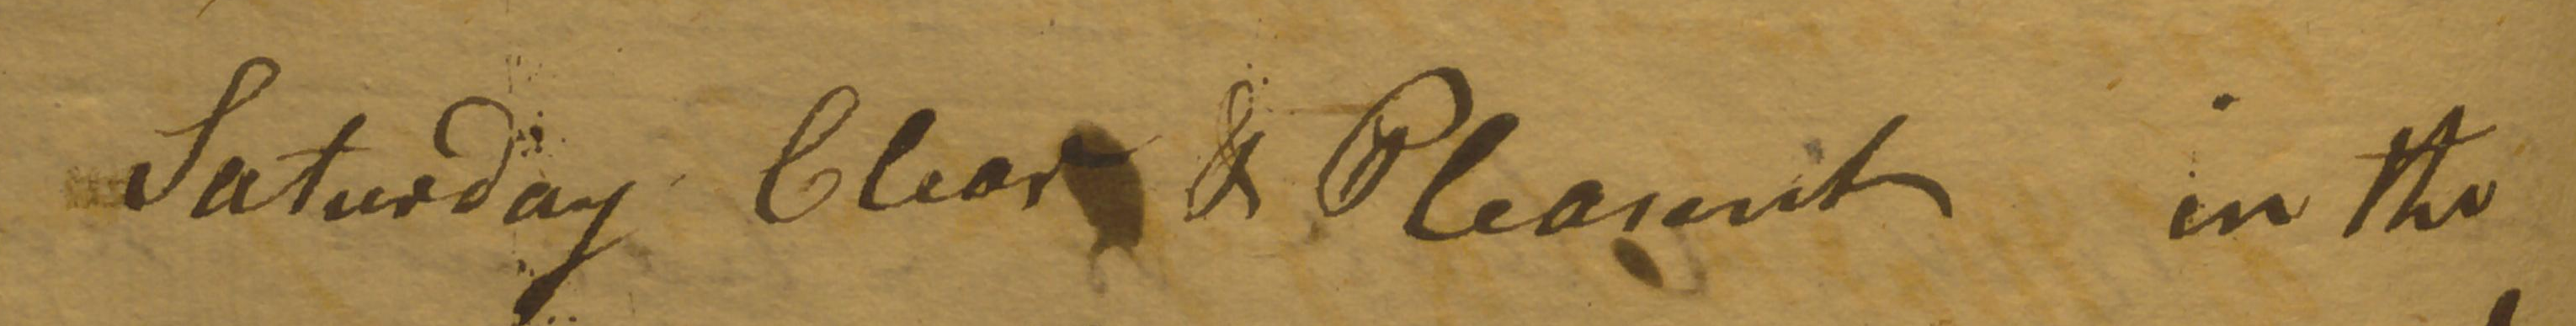Saturday Clear & Pleasent in the
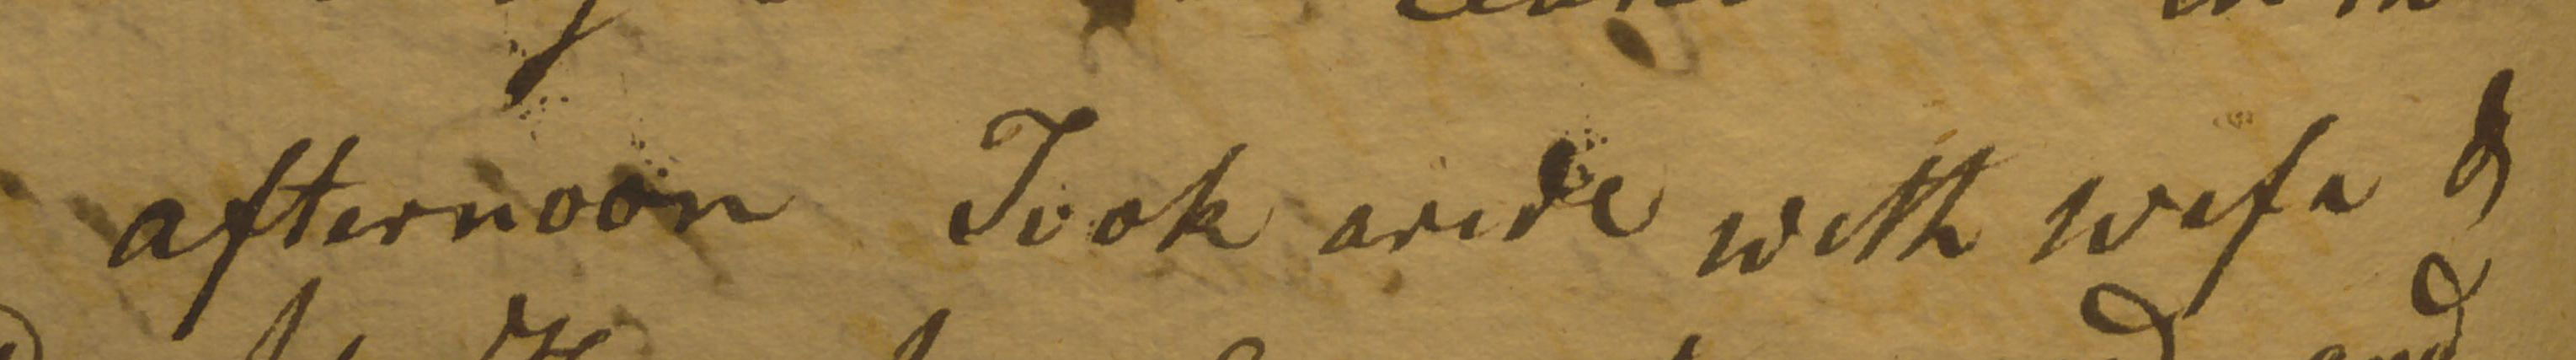afternoon Took a ride with wife &
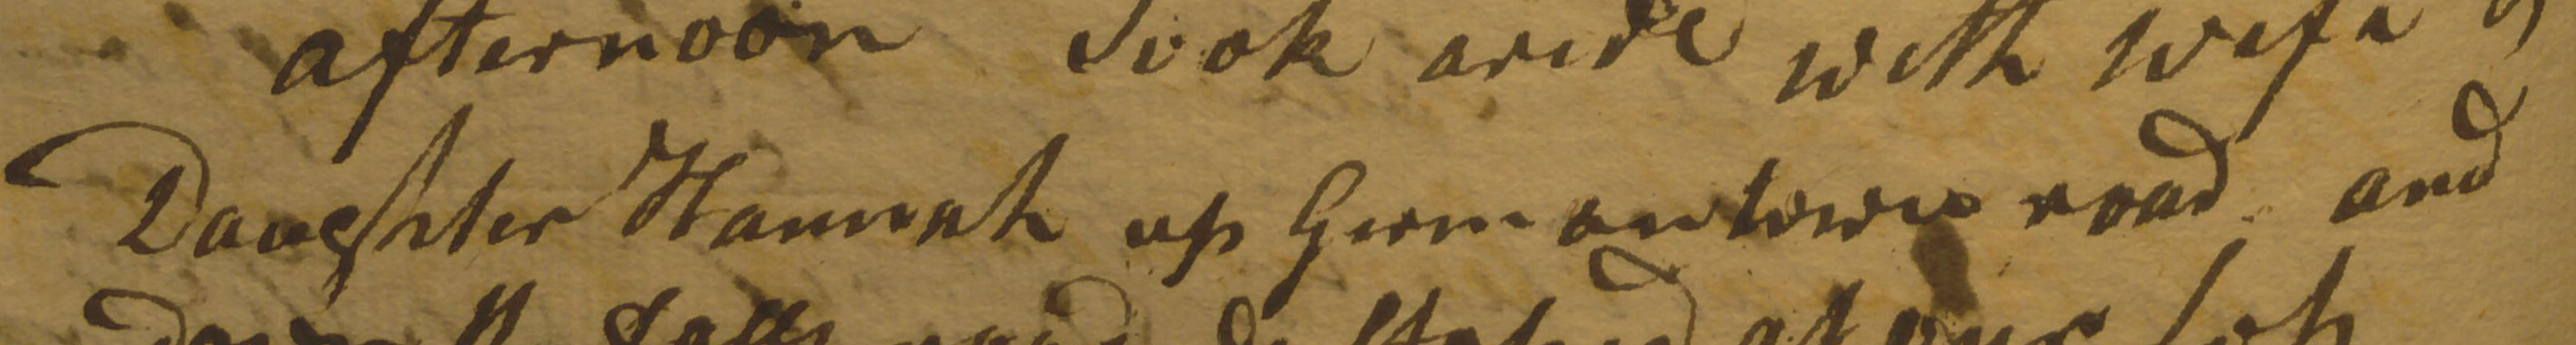Daughter Hannah up Germantown road. and
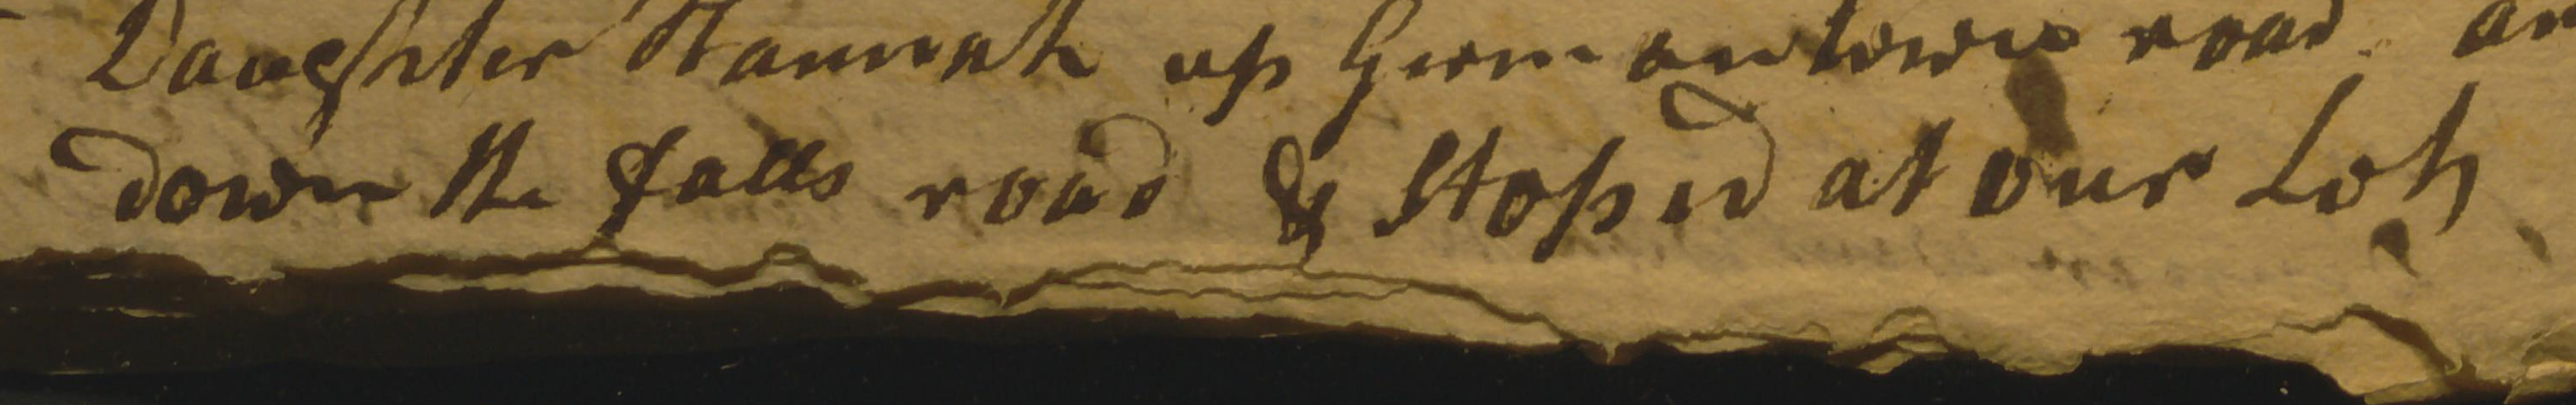Town the falls road & stoped at our Lots
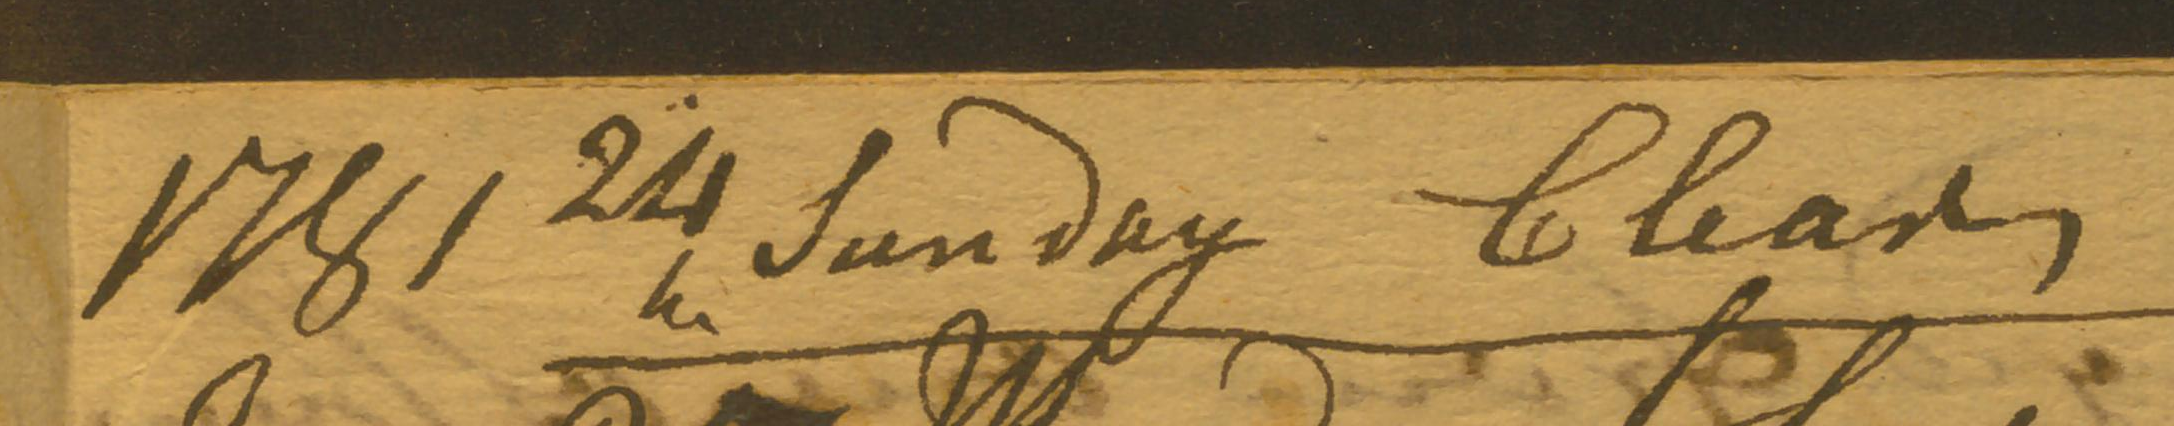1781 24 Sunday Clear
